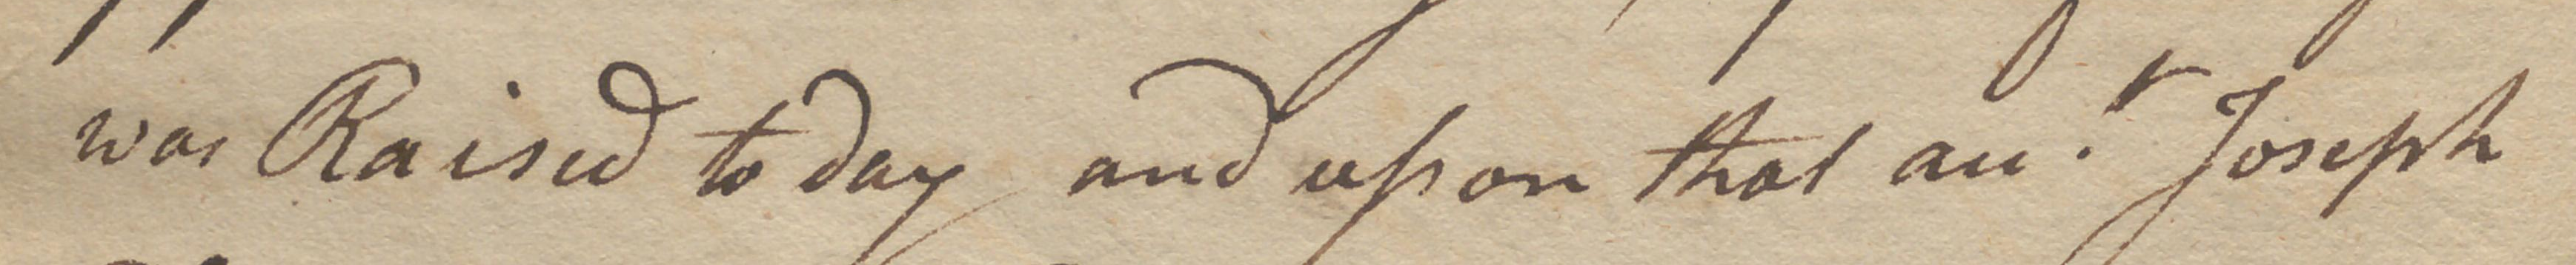was Raised to day and upon that acc^t. Joseph
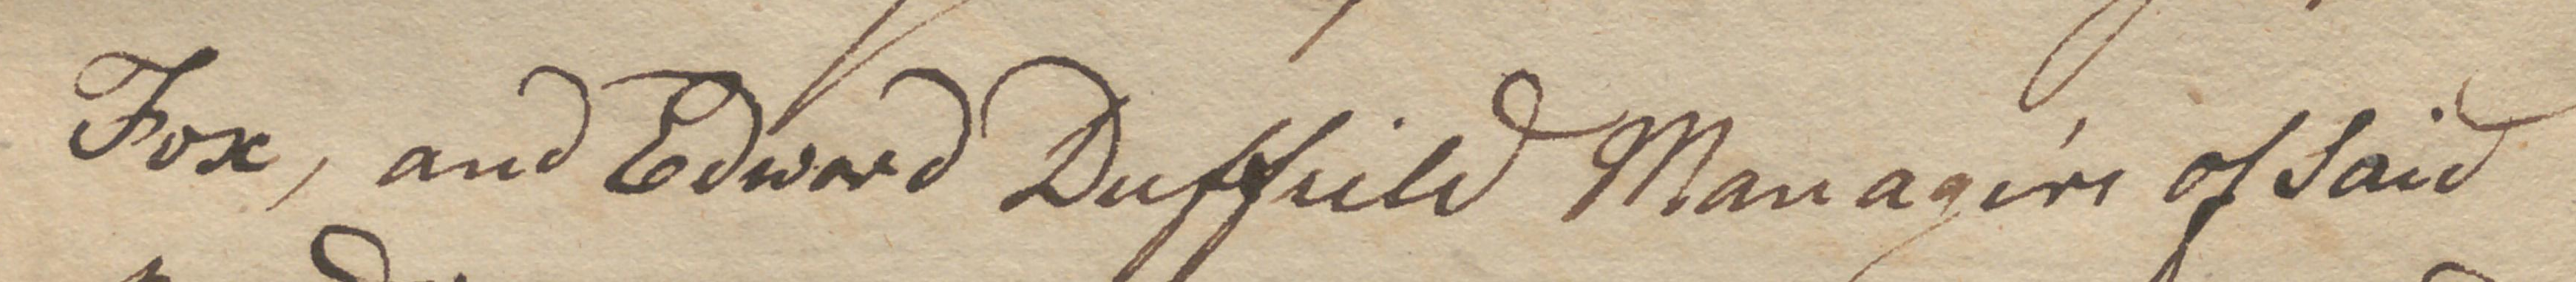Fox, and Edward Duffield Managers of said
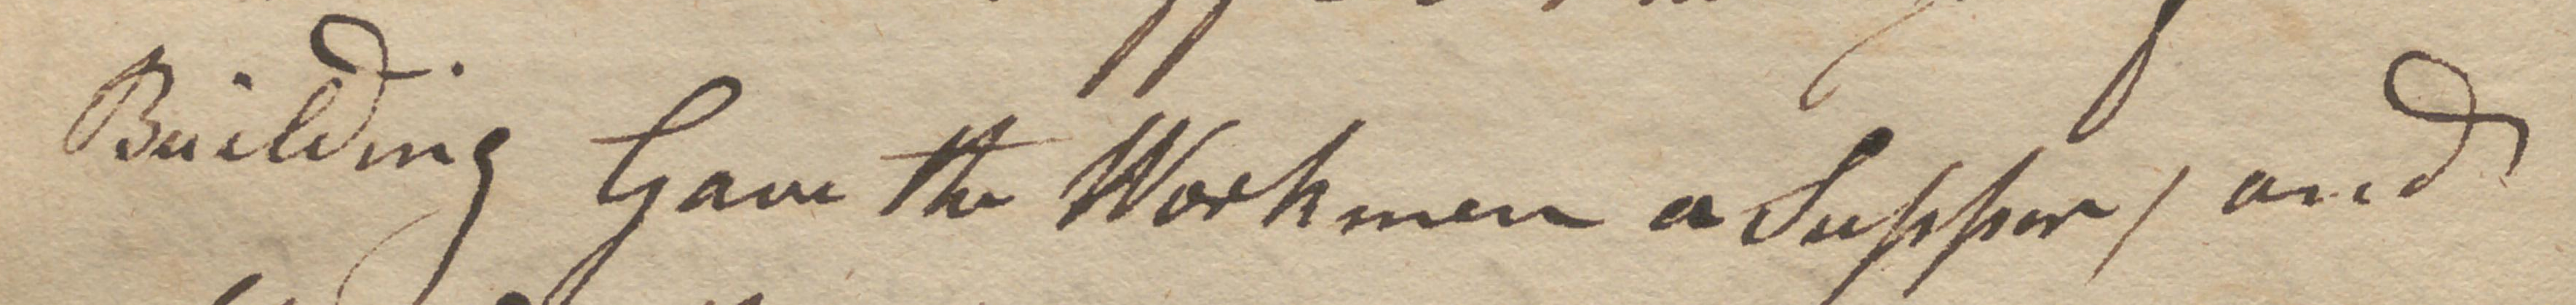Building Gave the Workmen a Supper, and
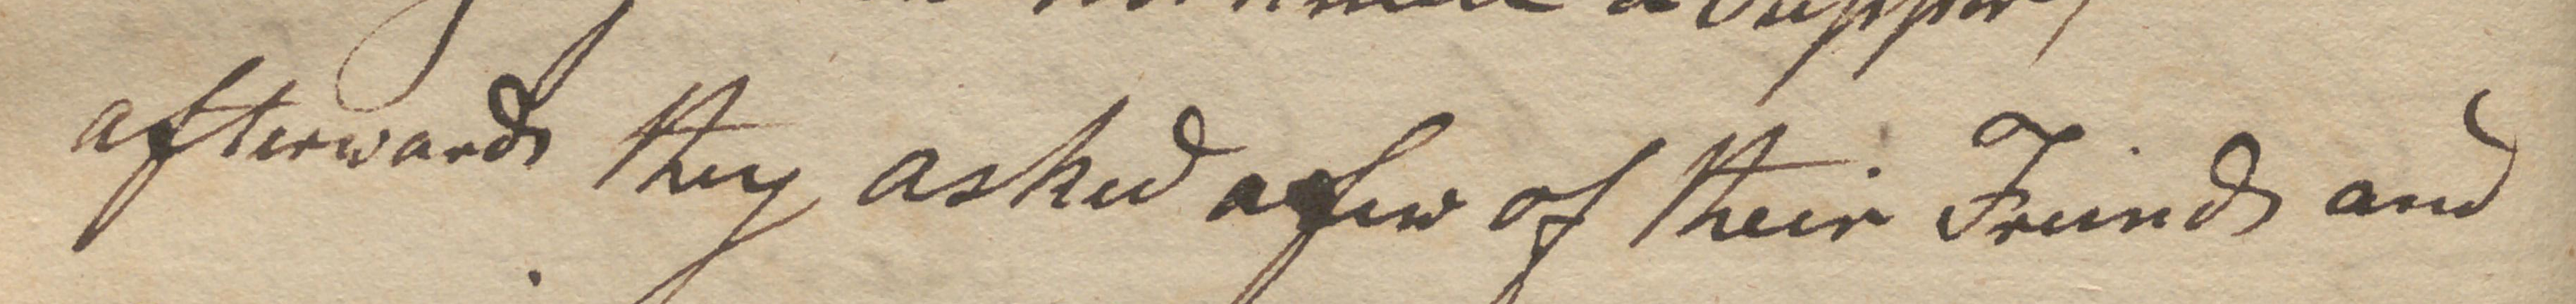afterwands they asked a few of their Friends and
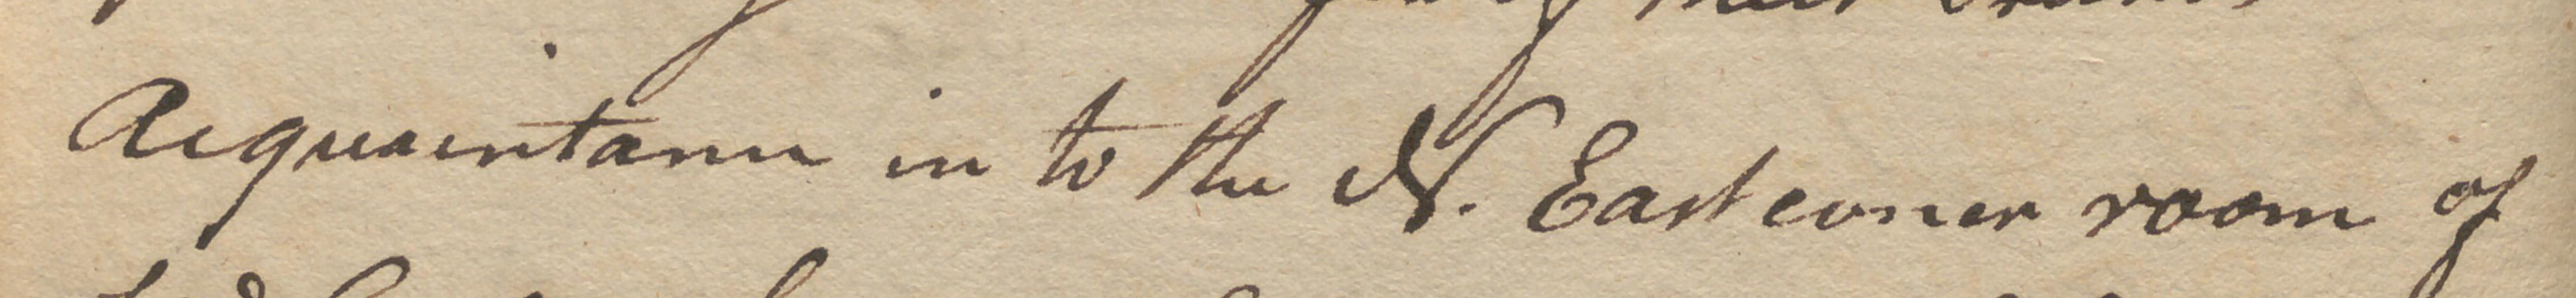Acquaintance in to the N. East corner room of
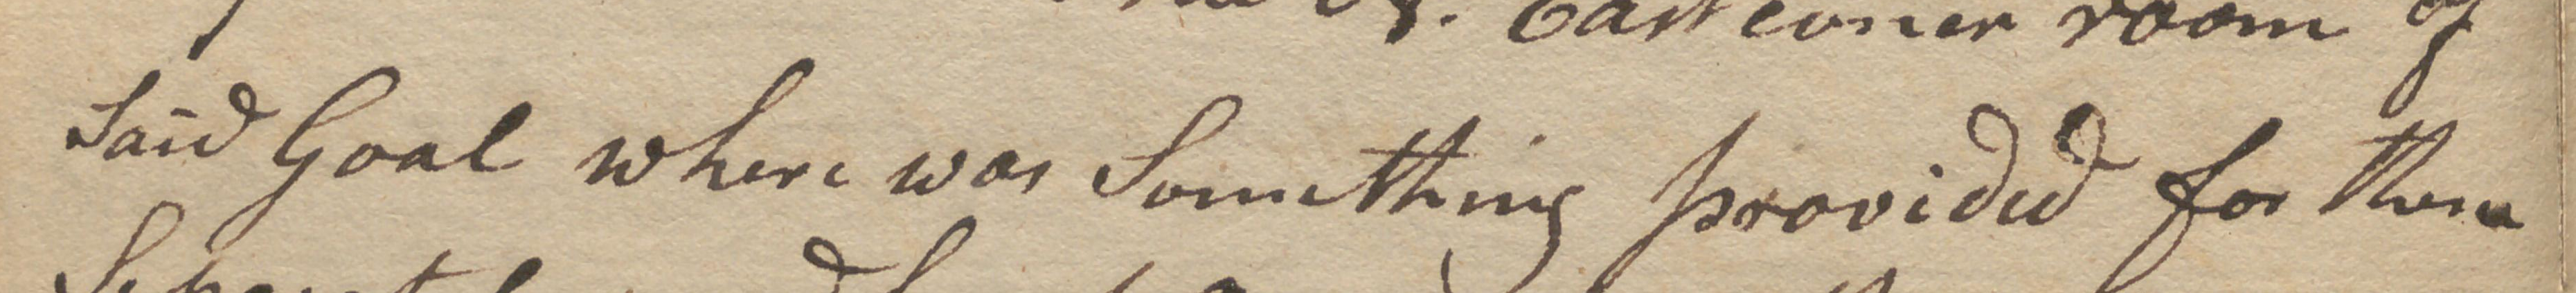Said Goal where was Something provided for there
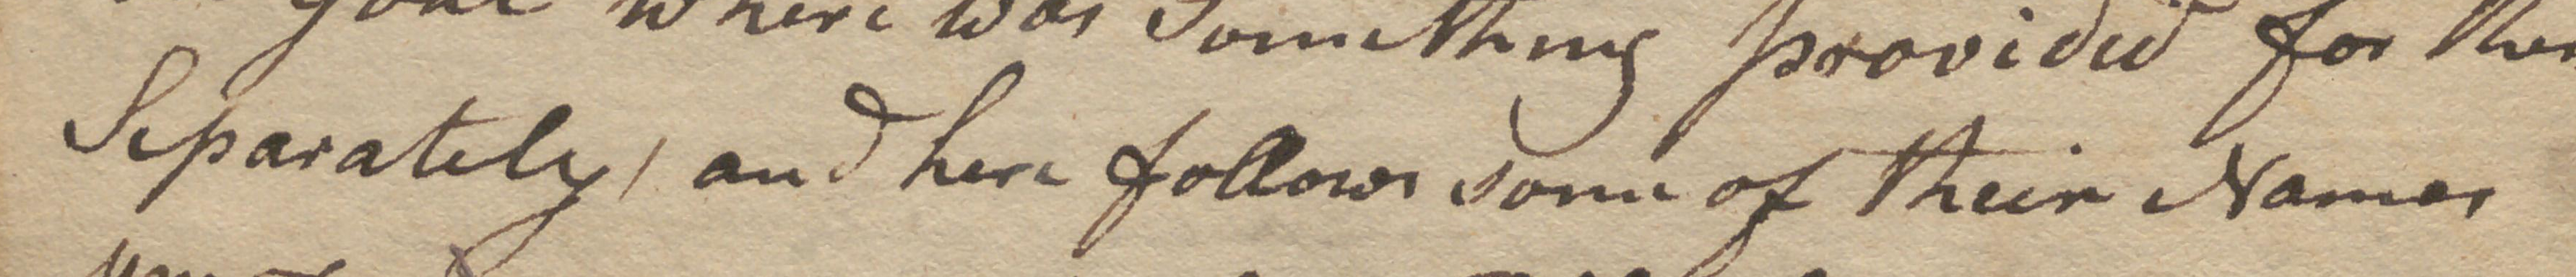Separately, and here follows some of their Names
